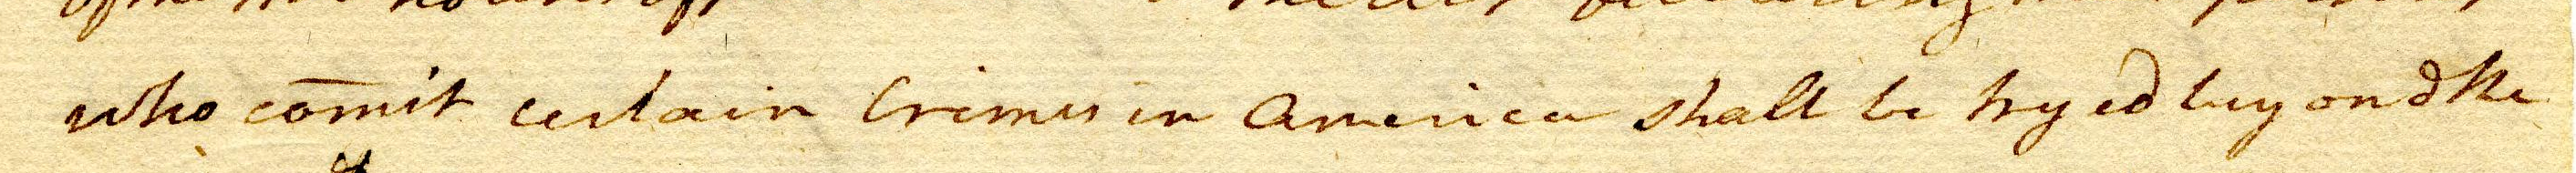who com̄it certain Crimes in America shall be tryed beyond the
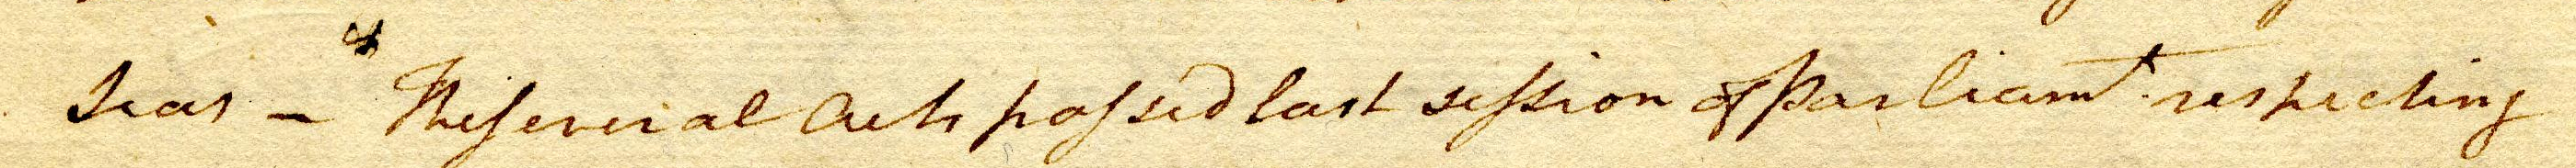seas- Theseveral Acts passed last session of Parliam^t. respecting
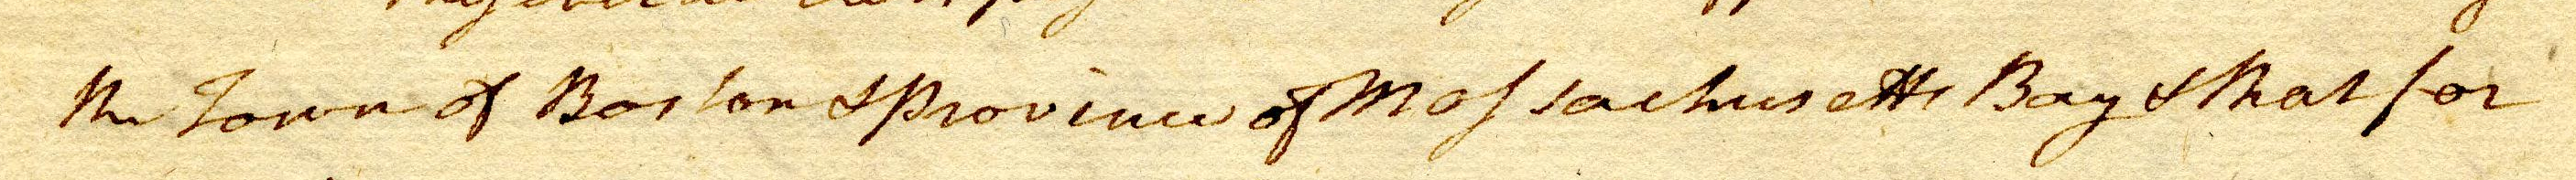the Town of Boston & Province of Massachusetts Bay & that for
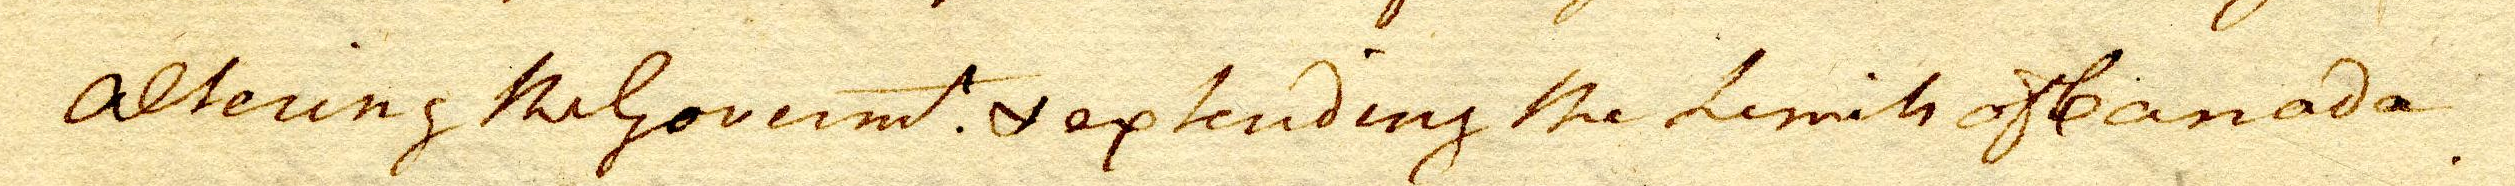altering the Goverm^t. & extending the Limits of Canada
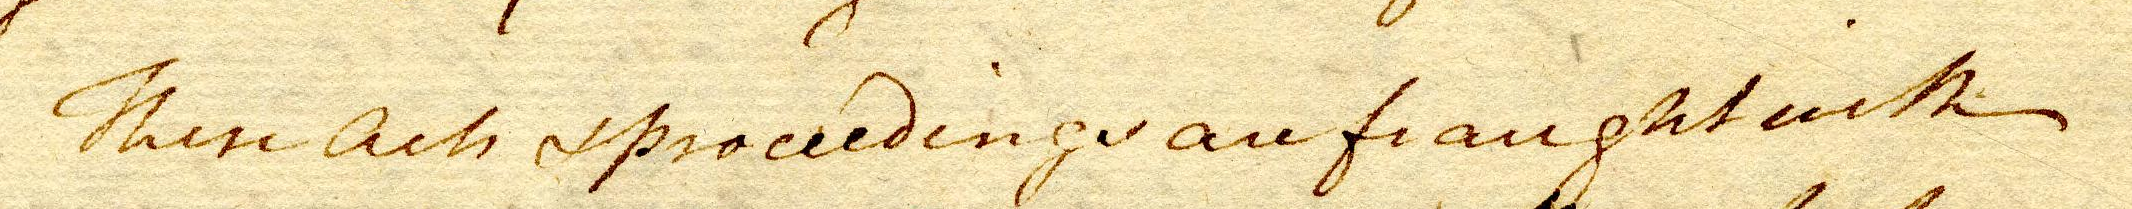These Acts & proceedings are fraught with
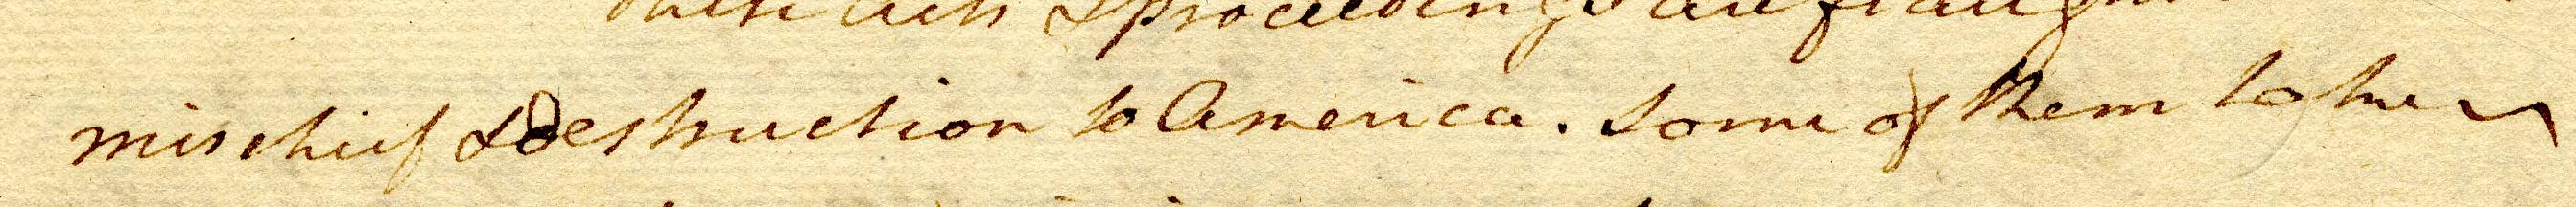mischief & destruction to America. Some of them [take]
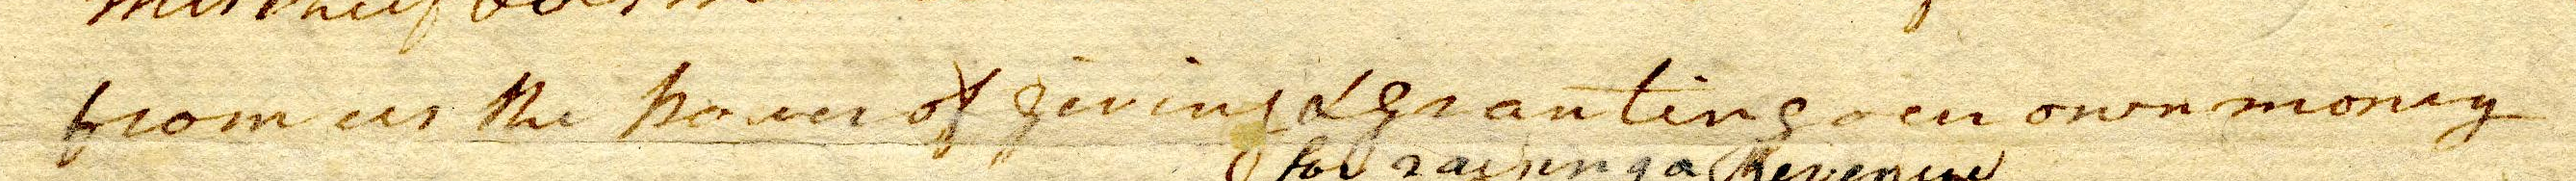from us the power of giving & granting our own money
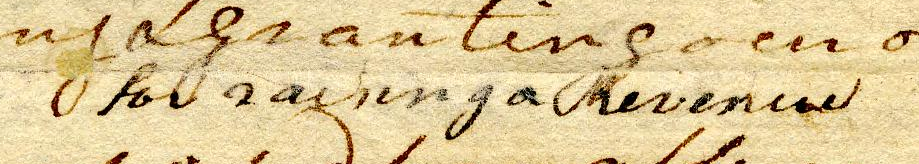for raising a Revenue
